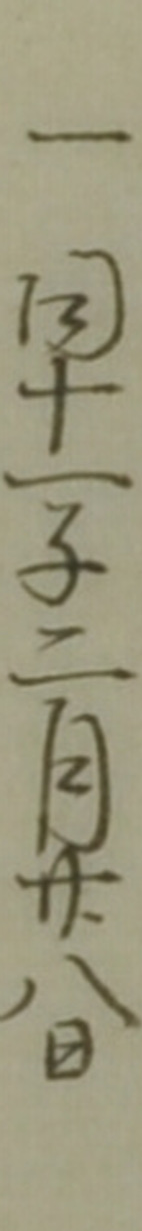一同十一子二月廿八日
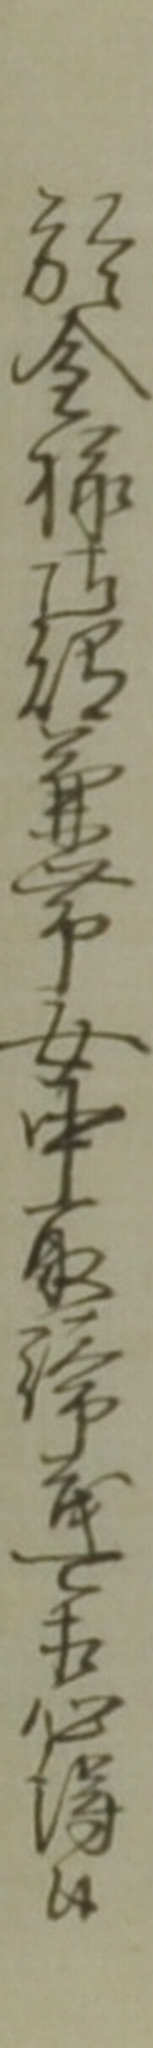於金様御賄兼帯女中取締茂可相心得候
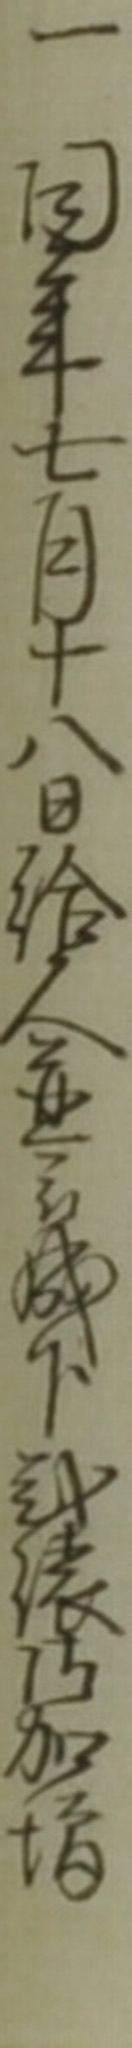一同年七月十八日給人並被成下弐俵御加増
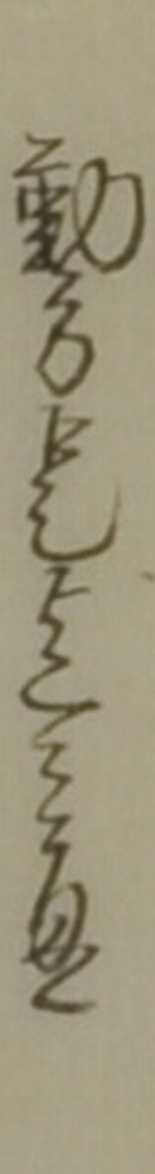勤方是迄之通
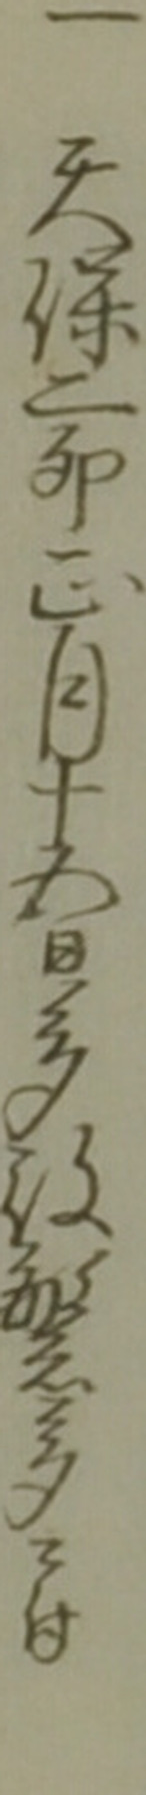一天保二卯正月十五日多役繁多ニ付
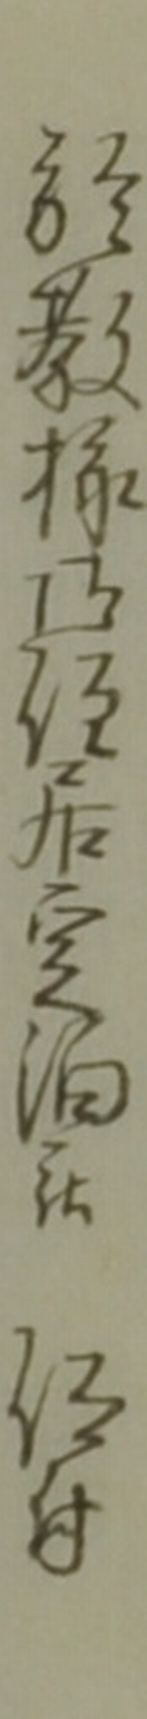於教様御住居定泊被仰付
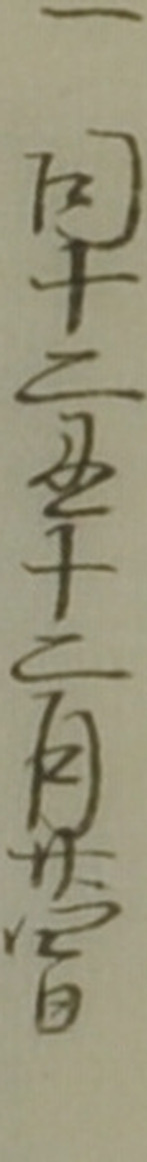一同十二丑十二月廿四日
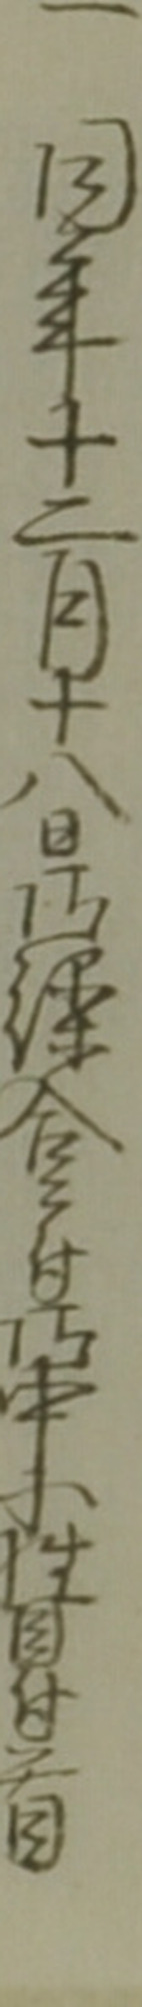一同年十二月十八日御繰合ニ付御中小性目付首
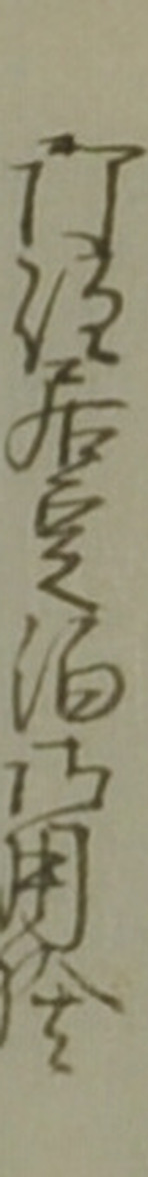御住居定泊御用捨
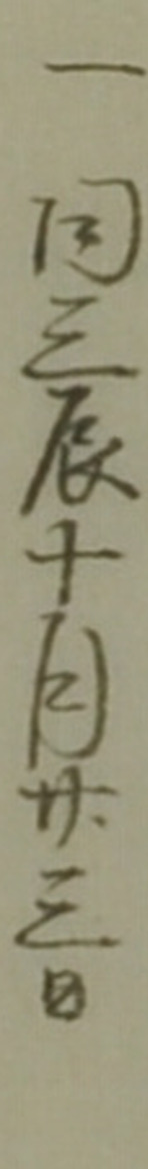一同三辰十月廿三日
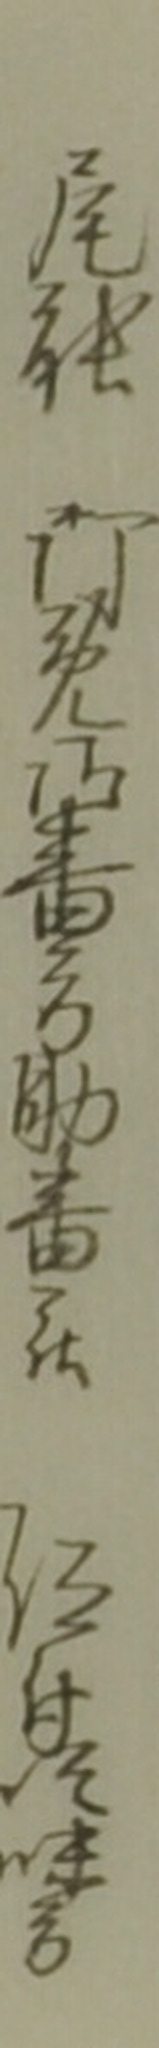尾能御免御番方助勤被仰付吟味方
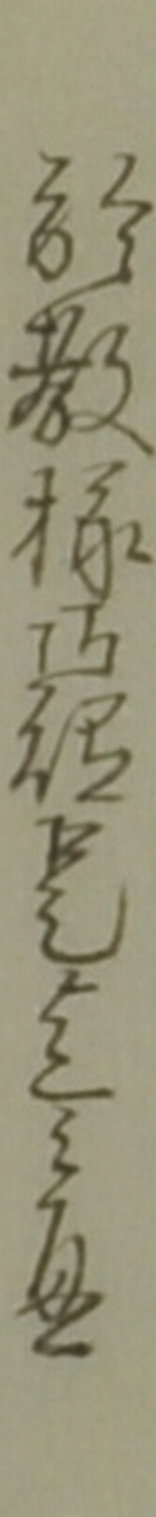於教様御賄是迄之通
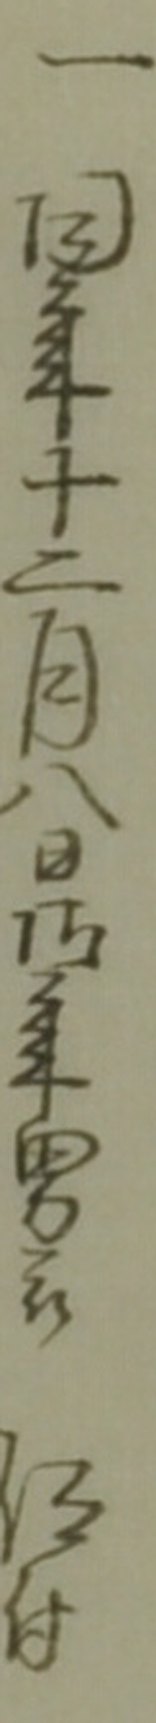一同年十二月八日御年男被仰付
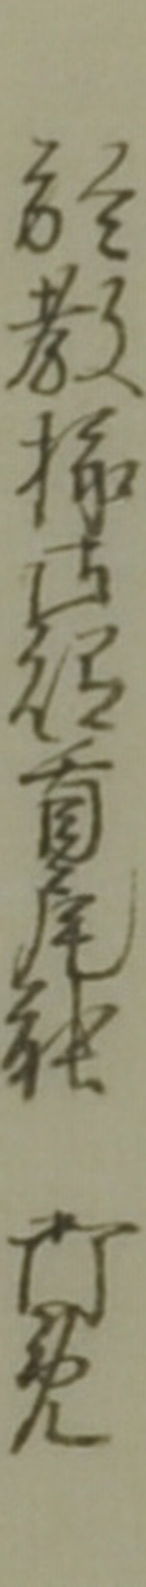於教様御賄首尾能御免
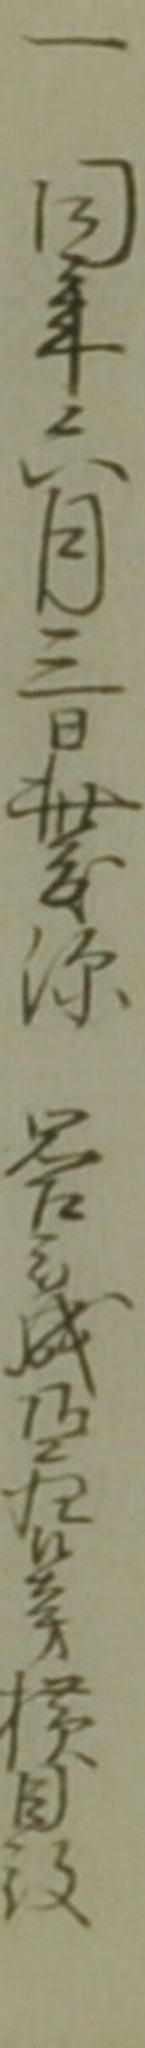一同年六月三日此度深思召被成御座候旁横目役
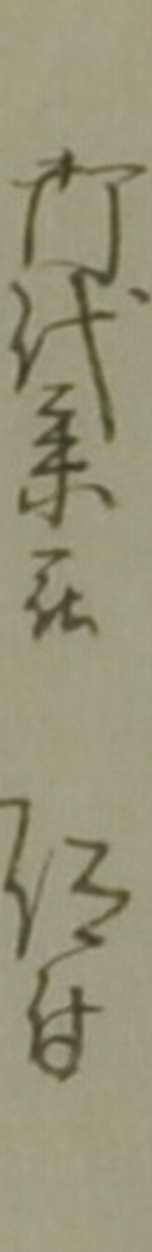御代参被仰付
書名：無足諸士勤仕録（一）
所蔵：伊那市立高遠町図書館・合同会社AMANE
